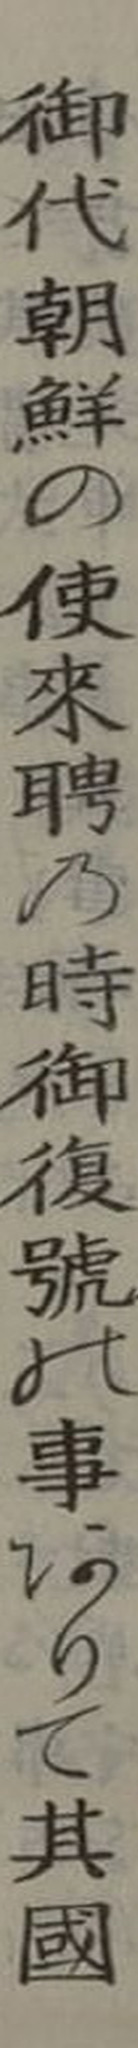御代朝鮮の使來聘の時御復號の事ありて其國
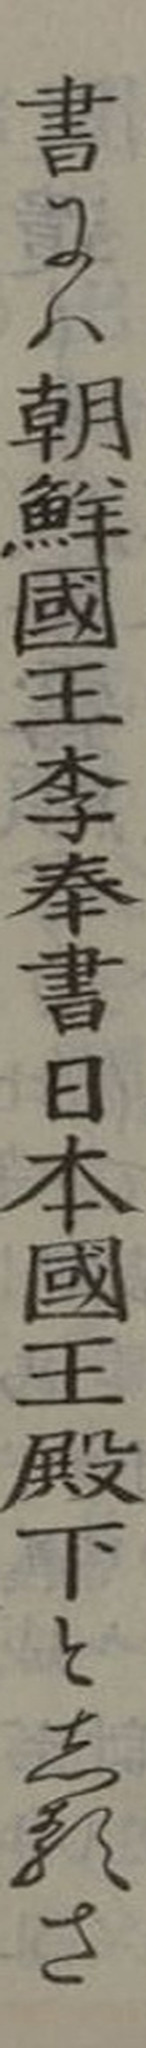書にハ朝鮮國王李奉書日本國王殿下としるさ
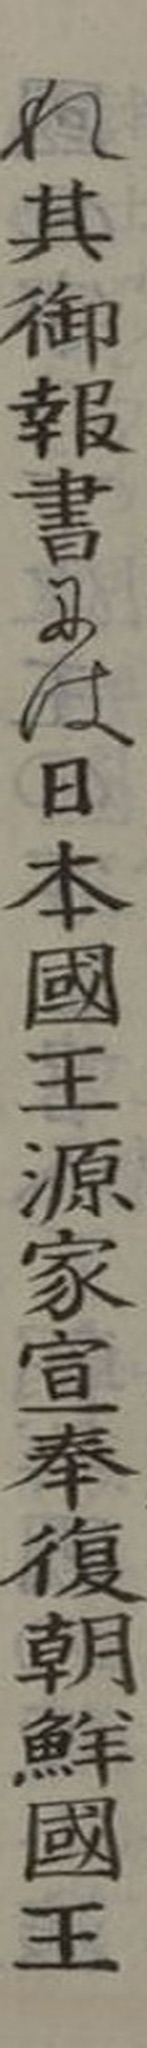れ其御報書には日本國王源家宣奉復朝鮮國王
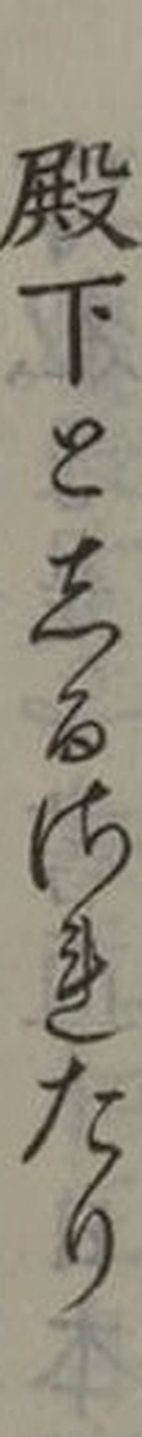殿下としるされたり
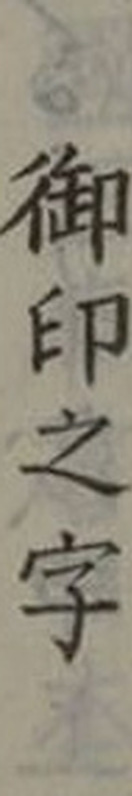御印之字
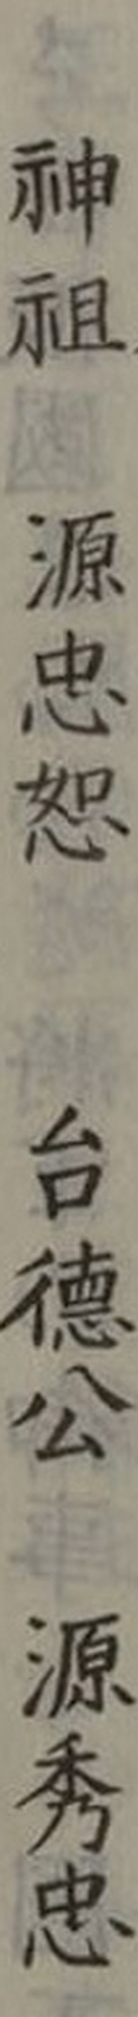神祖源忠恕台德公源秀忠
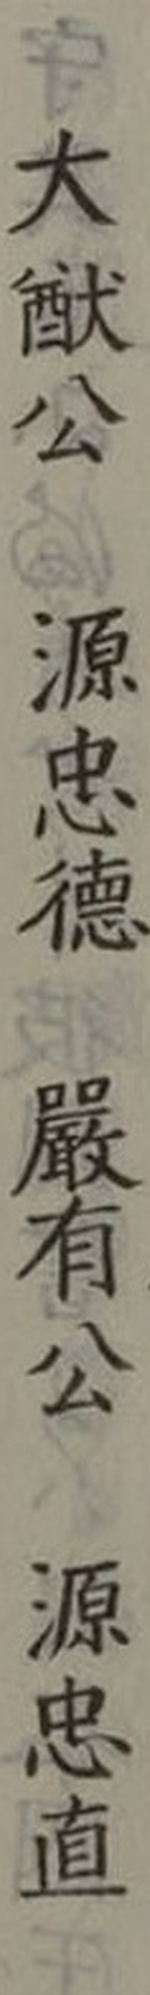大獸公源忠德嚴有公源忠直
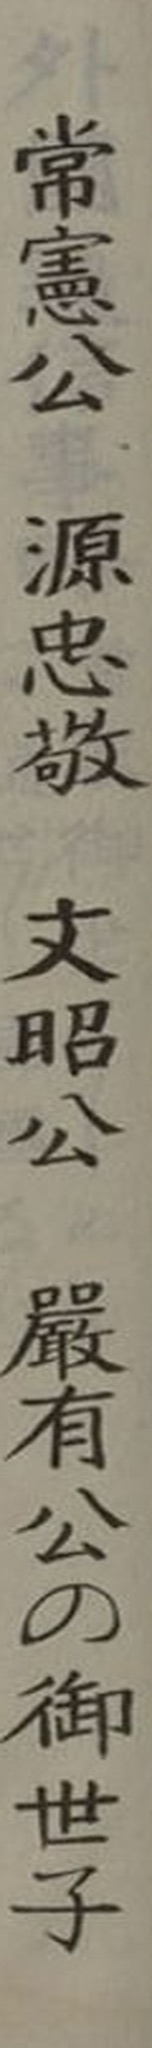常憲公源忠敬文昭公嚴有公の御世子
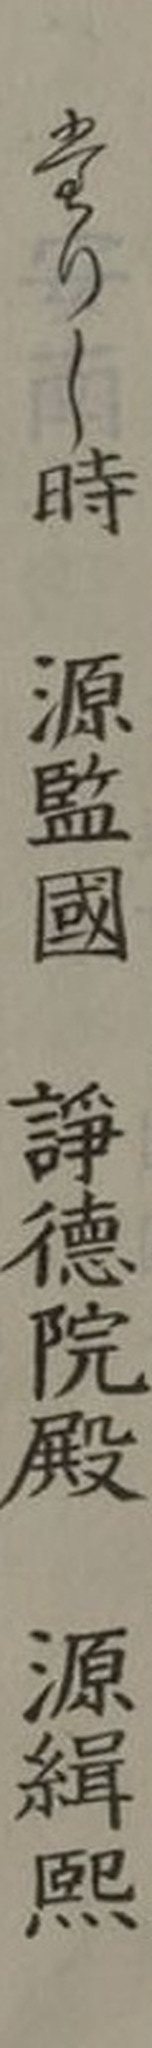たりし時源監國諍德院殿源緝熙

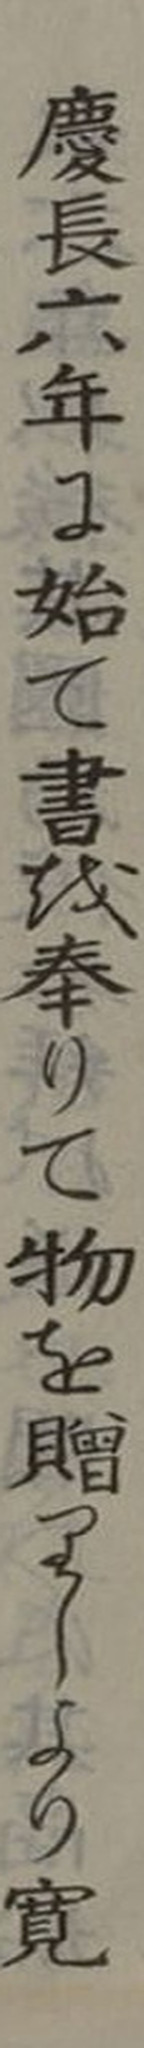慶長六年に始て書を奉りて物を贈りしより寛
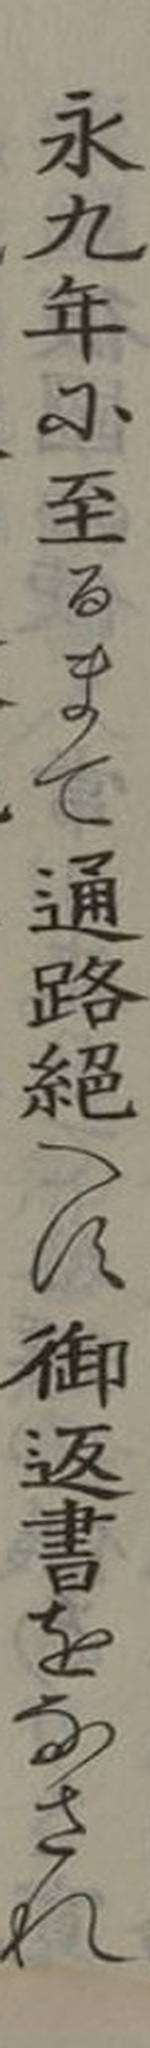永九年に至るまて通路絕へす御返書をなされ
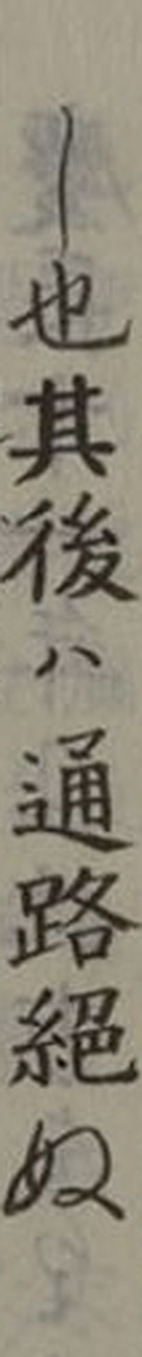し也其後は通路絕ぬ
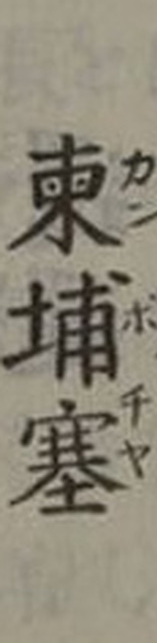柬埔塞
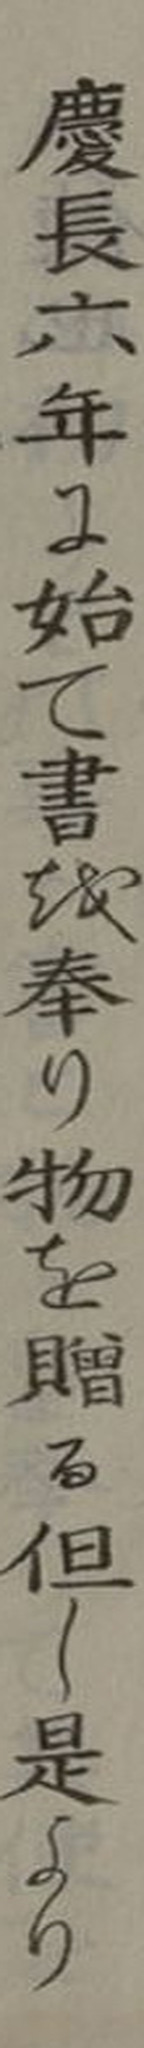慶長六年に始て書を奉り物を贈る但し是より
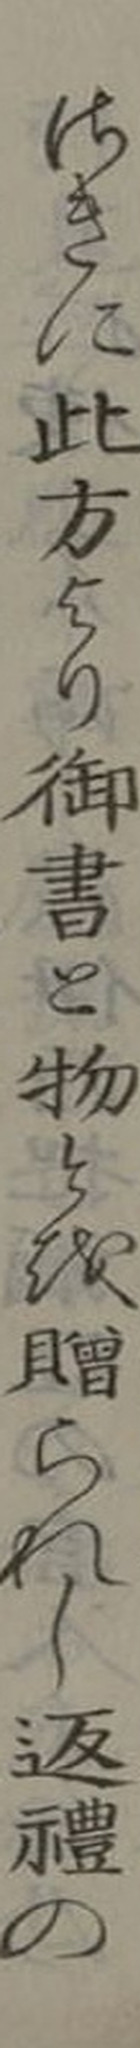さきに此方より御書と物とを贈られし返禮の
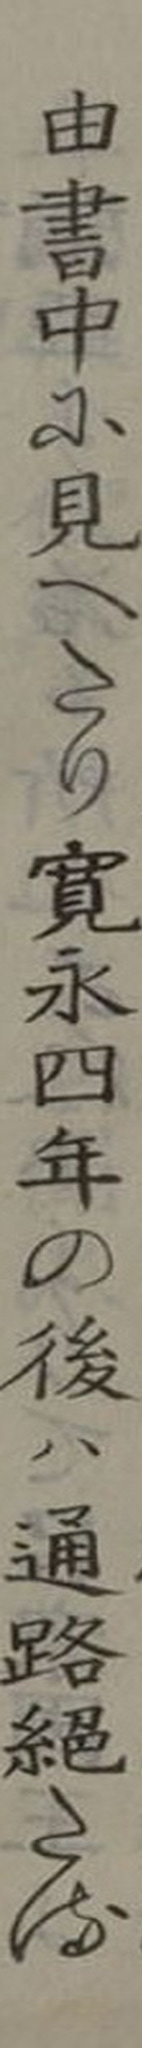由書中に見へたり寛永四年の後は通路絕たる
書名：骨董録
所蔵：University of the Ryukyus Library
